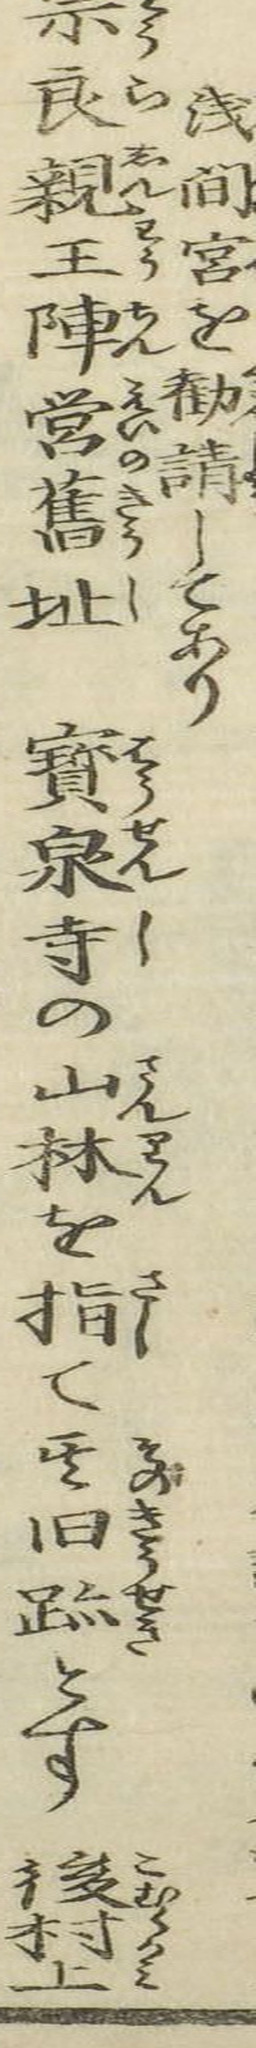宗良親王陣営旧址宝泉寺の山林を指て其旧跡とす後村上
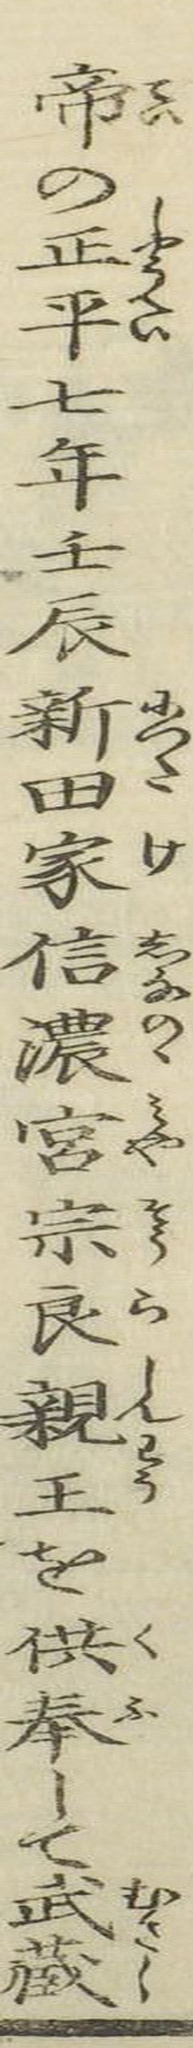帝の正平七年壬辰新田家信濃宮宗良親王を供奉して武蔵
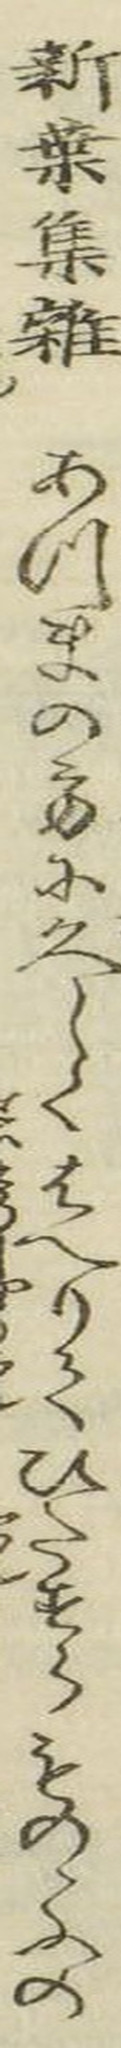新葉集雑あつまの方に久しくはへりてひたすらものゝふの
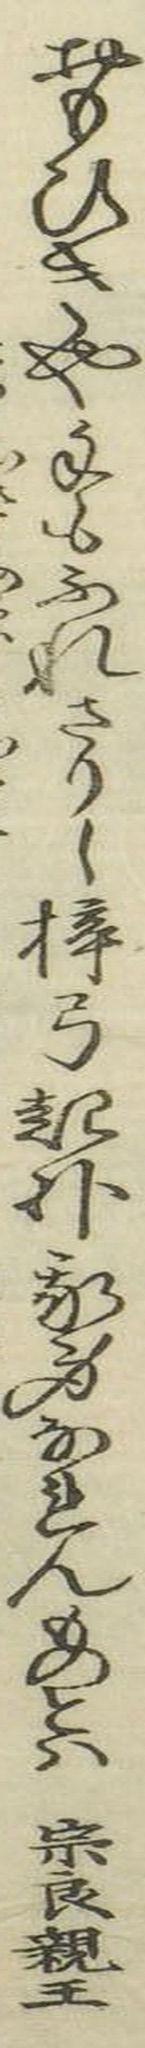おもひきや手もふれさりし梓弓起臥我身なれんものとは宗良親王
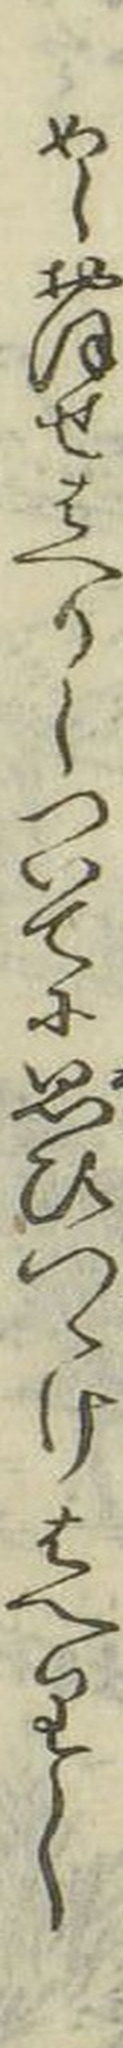めしおほせはへりしついてに思ひつゝけはへりし
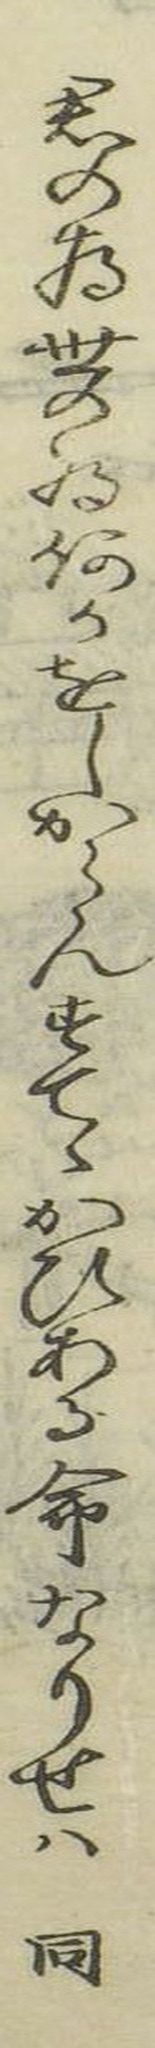君の為世の為何かをしからんすてゝかひある命なりせは同

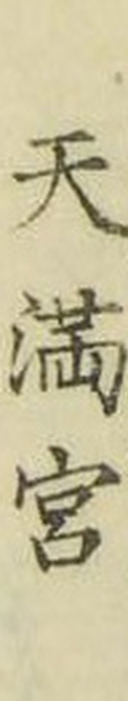天満宮
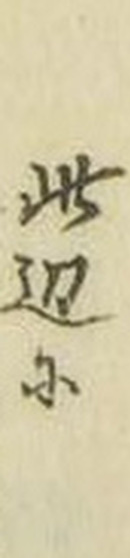此辺に
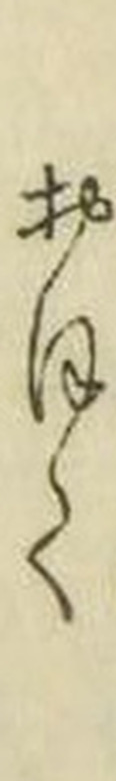おほく
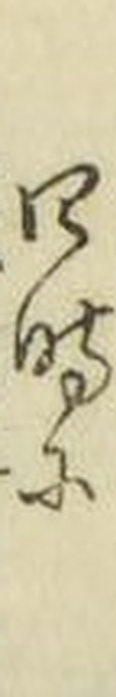四時に
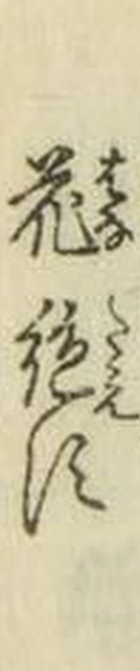花絶す
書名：江戸名所図会 20巻 巻之11
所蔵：東京学芸大学教育コンテンツアーカイブ
